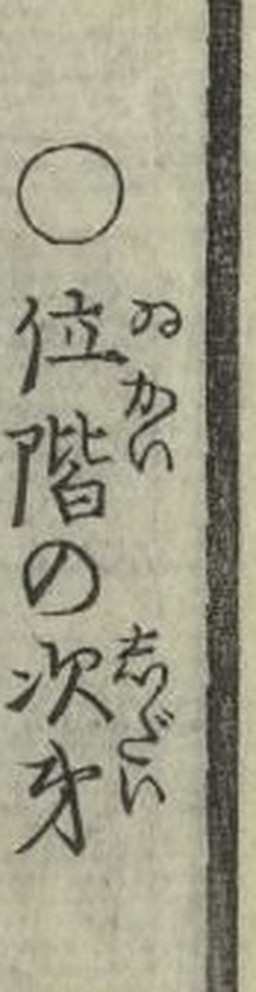○位階の次第
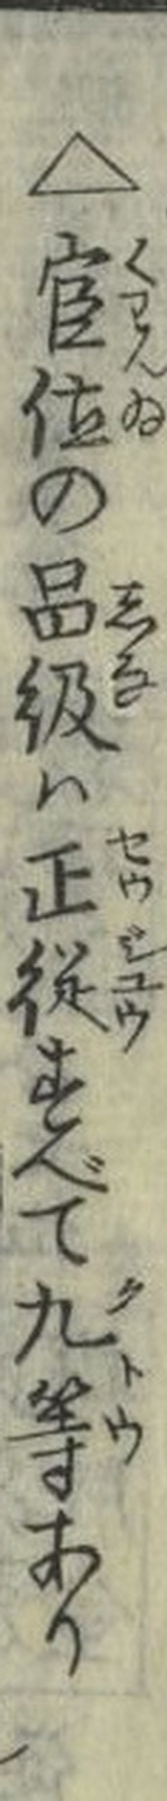△官位の品級は正従すべて九等あり
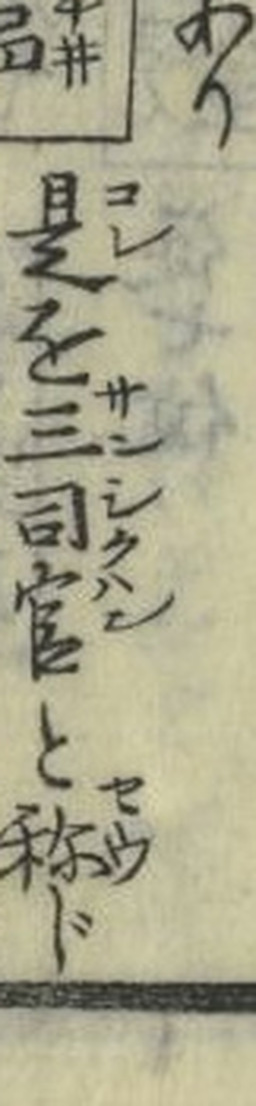是を三司官と称じ
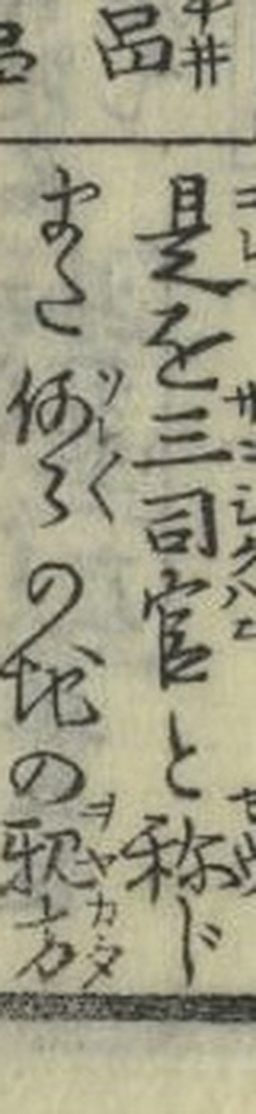また例々の地の親方
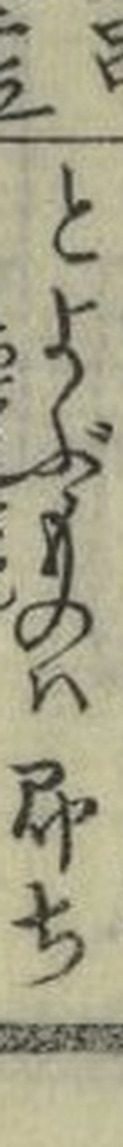とよぶものは即ち
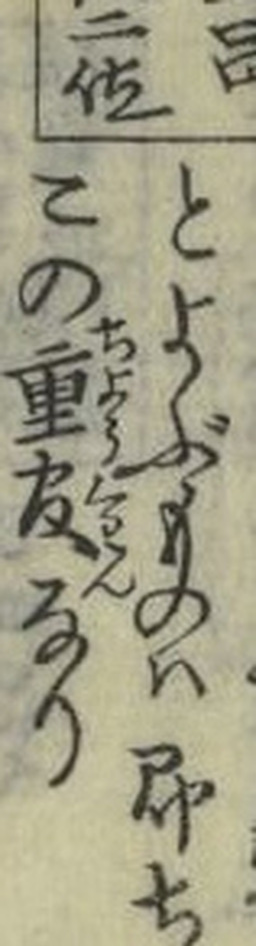この重官なり

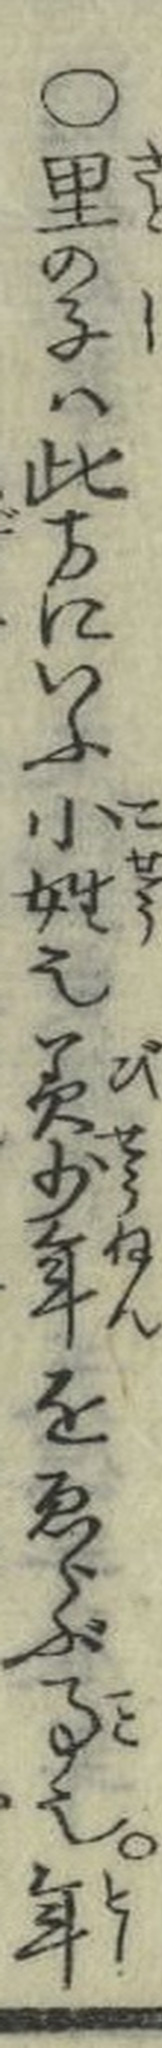○里の子は此方にいふ小姓也美少年をゑらぶ事也。年
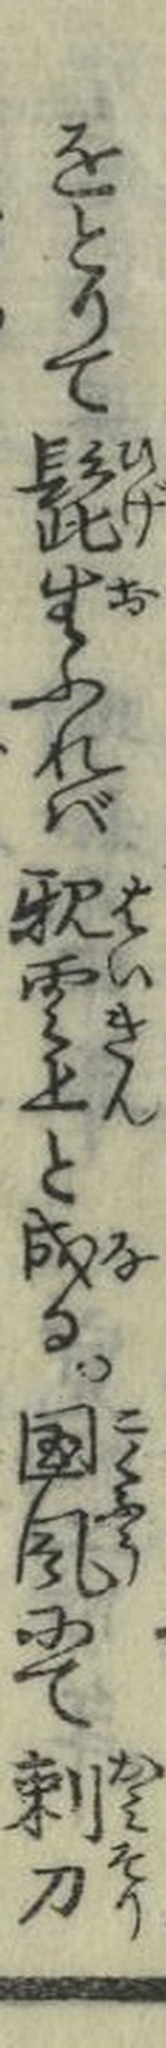をとりて髭生ふれば親雲上と成る。国風にて剌刀
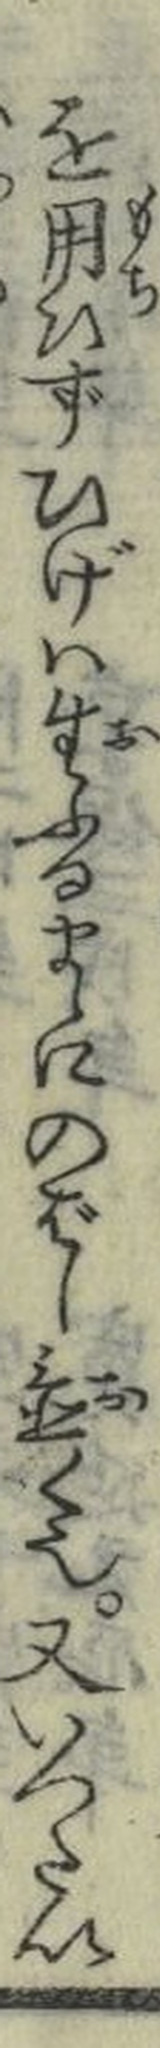を用ひずひげは生ふるまゝにのばし置く也。又いつたい
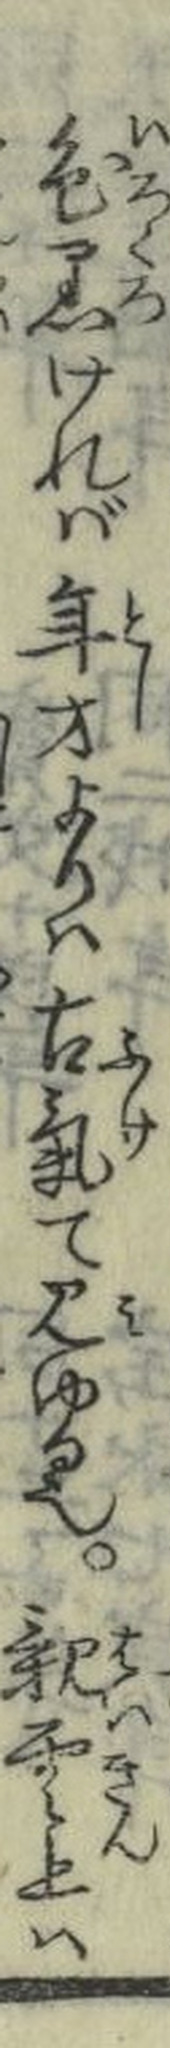色黒ければ年方よりは古気て見ゆる也。親雲上は
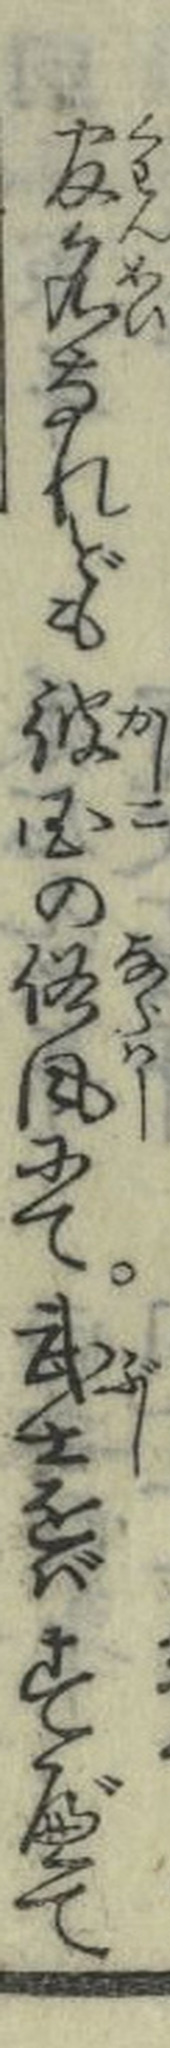官名なれども彼国の俗風にて。武士をばすべて
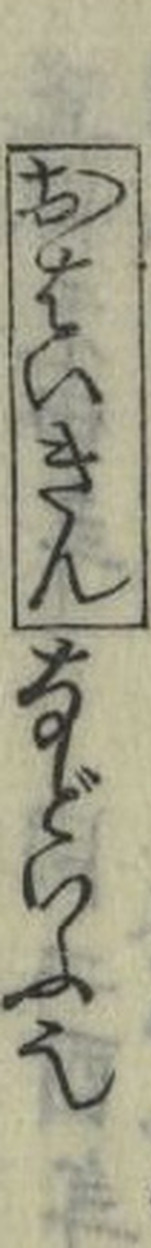「おはいきん」などいふ也

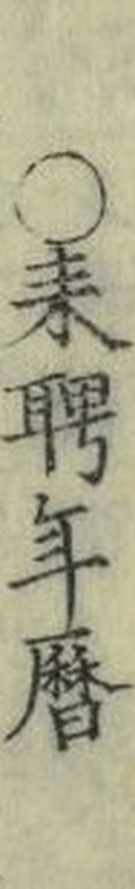○来聘年暦
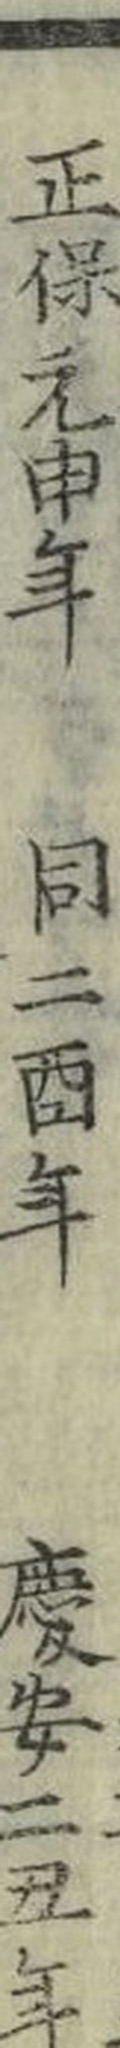正保元申年同二酉年慶安二丑年
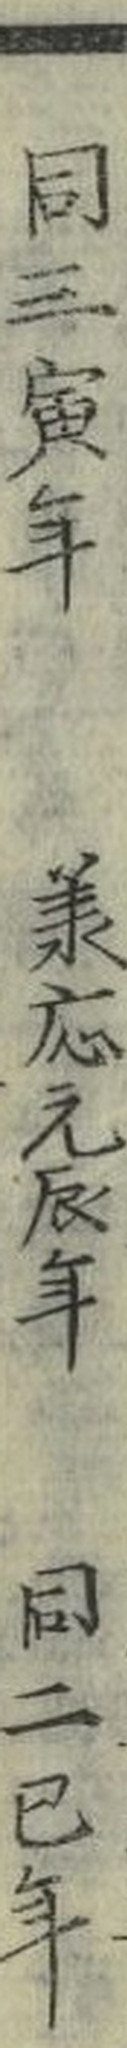同三寅年承応元辰年同二巳年
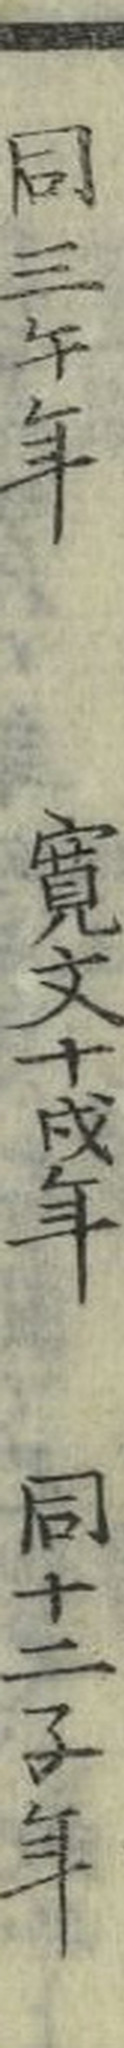同三午年寛文十戌年同十二子年
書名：琉球奇譚
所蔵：University of the Ryukyus Library
